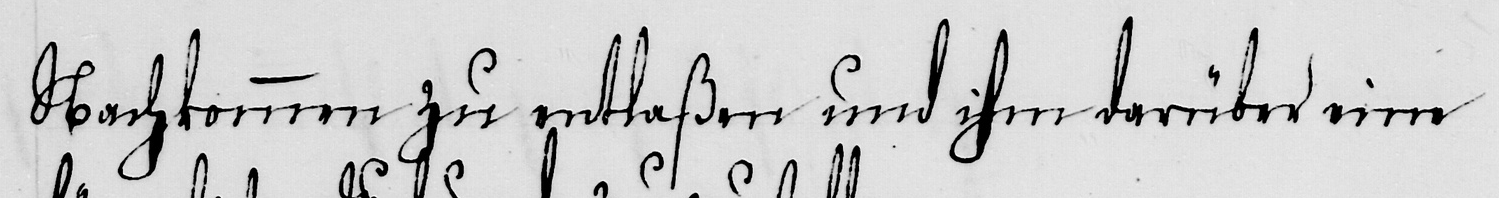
Nachkommen zu entlaßen und ihm darüber eine
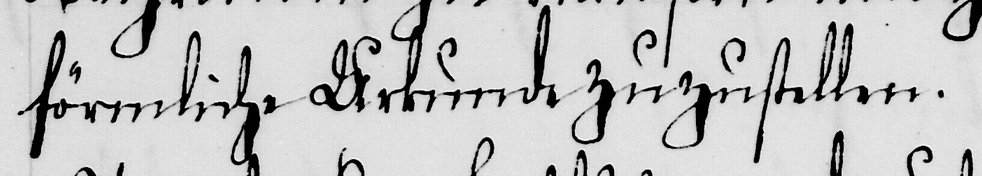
förmliche Urkunde zuzustellen.
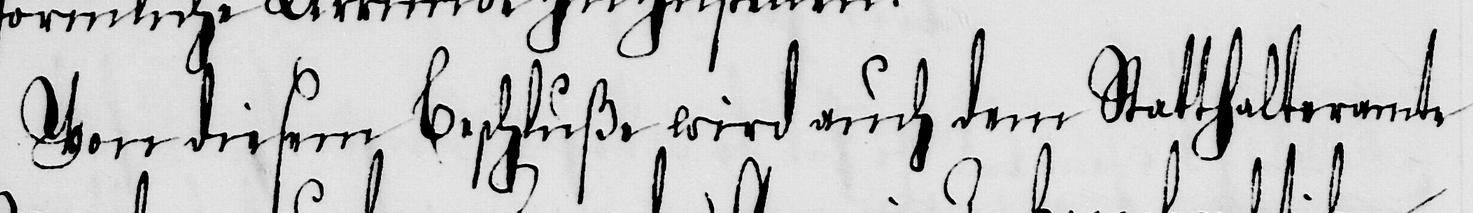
Von diesem Beschluße wird auch dem Statthalteramte
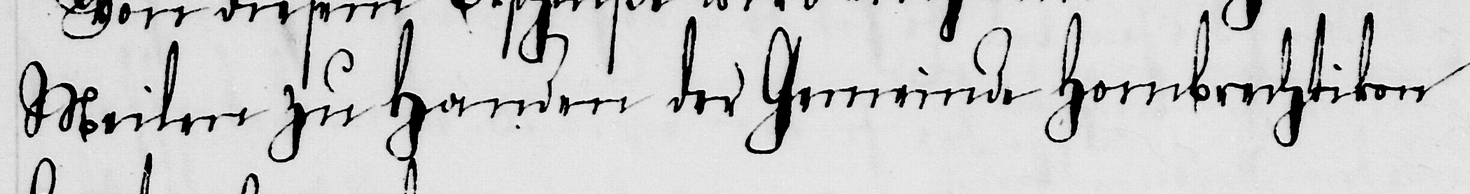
Meilen zu Handen der Gemeinde Hombrechtikon
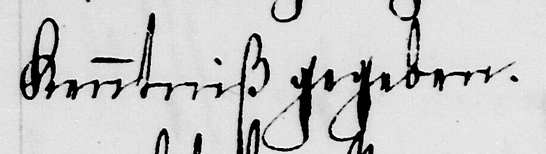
Kenntniß gegeben.
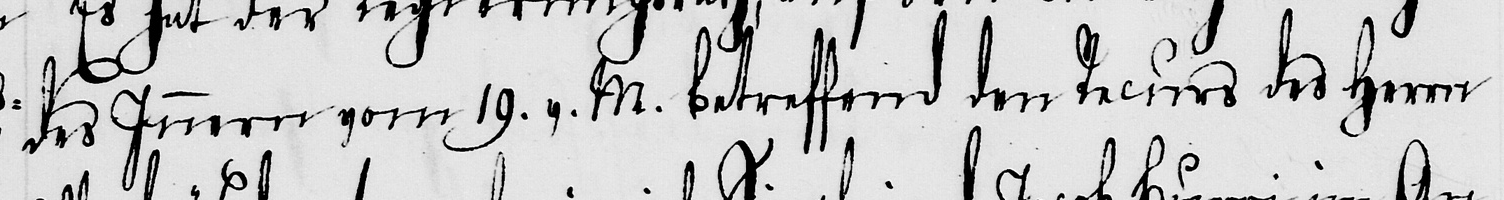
des Innern vom 19. v. M. betreffend den Recurs des Herrn
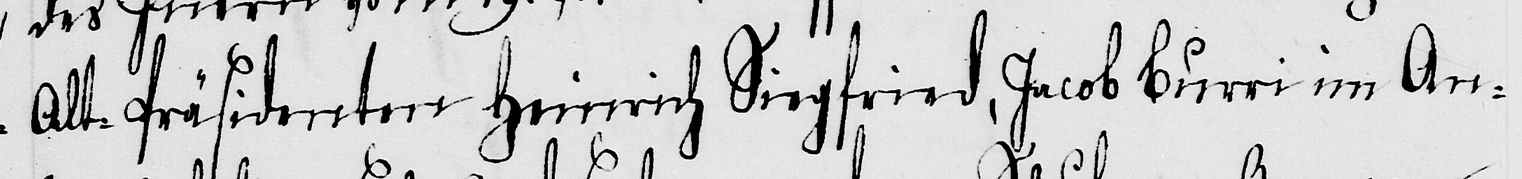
Alt-Präsidenten Heinrich Siegfried, Jacob Burri im An¬
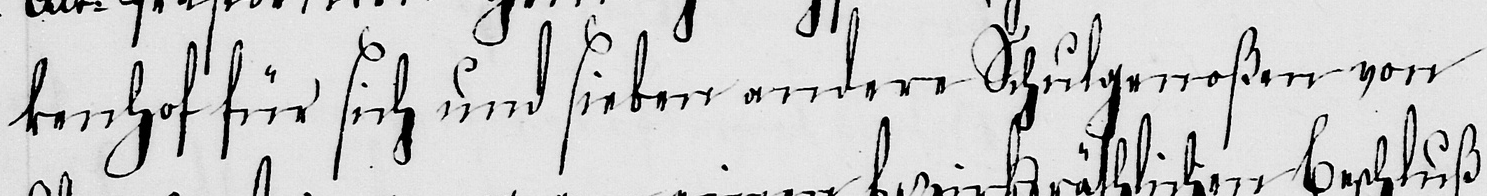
kenhof für sich und sieben andere Schulgenoßen von
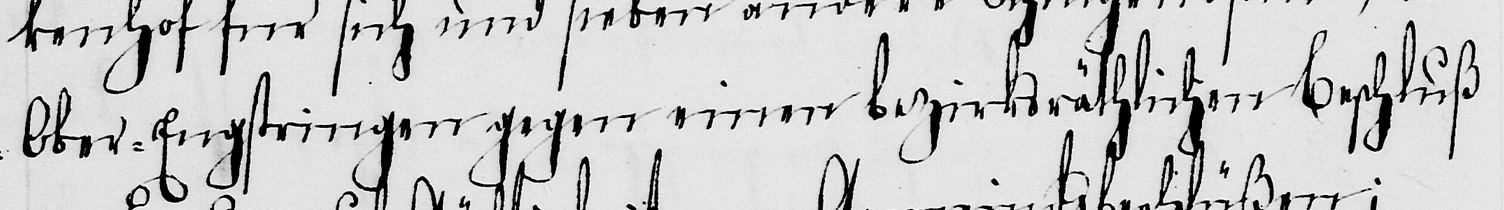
Ober-Engstringen gegen einen bezirksräthlichen Beschluß
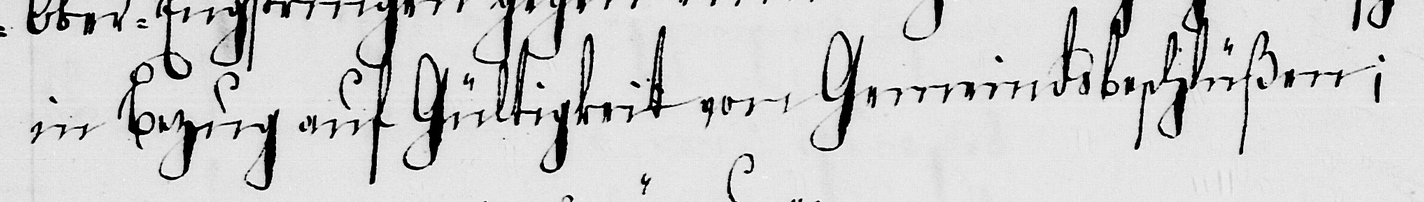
in Bezug auf Gültigkeit von Gemeindsbeschlüßen;
